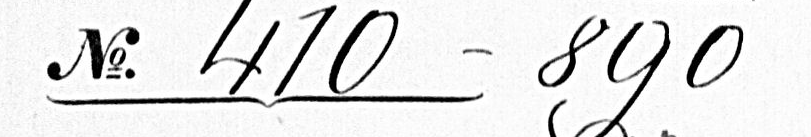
N° 410 - 890
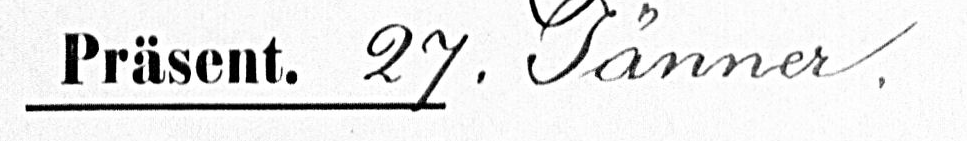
Präsent. 27. Jänner.
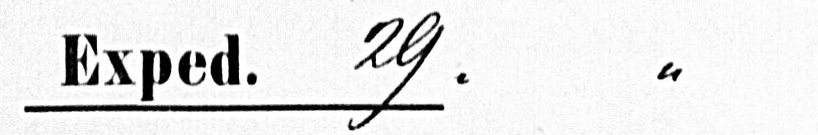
Exped. 29. Jänner.
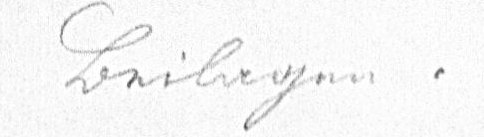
Beilagen.
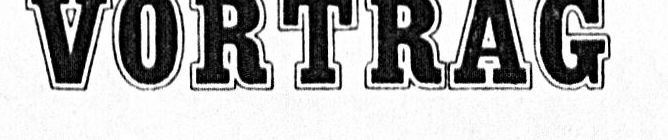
VORTRAG
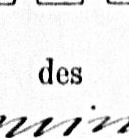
des
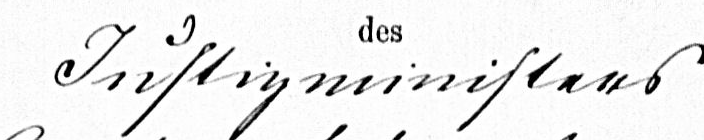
Justizministers
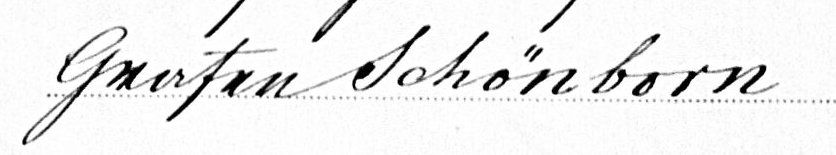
Grafen Schönborn
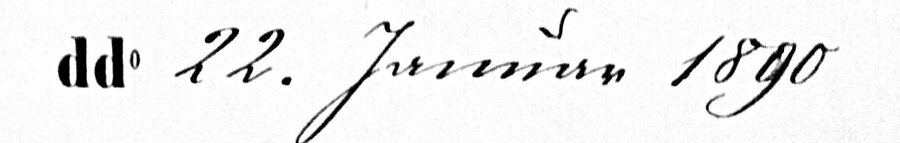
dd° 22. Januar 1890
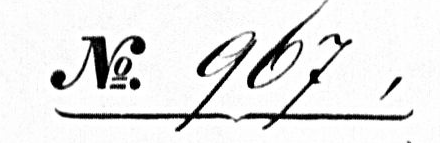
N° 967,
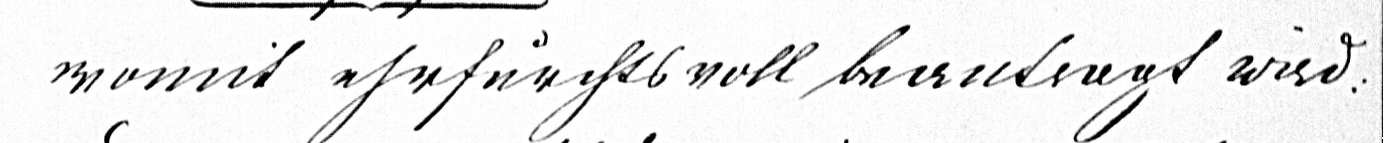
womit ehrfurchtsvoll beantragt wird:
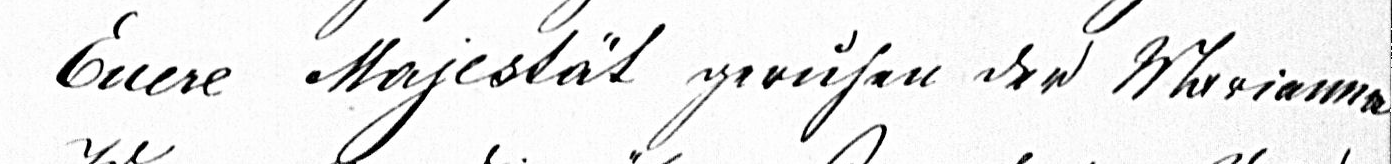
Euere Majestät geruhen der Marianna
